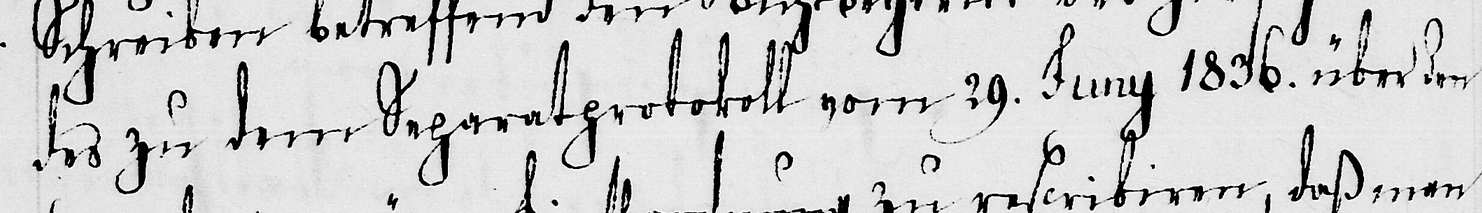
des zu dem Separatprotokoll vom 29. Juny 1836. über d¬
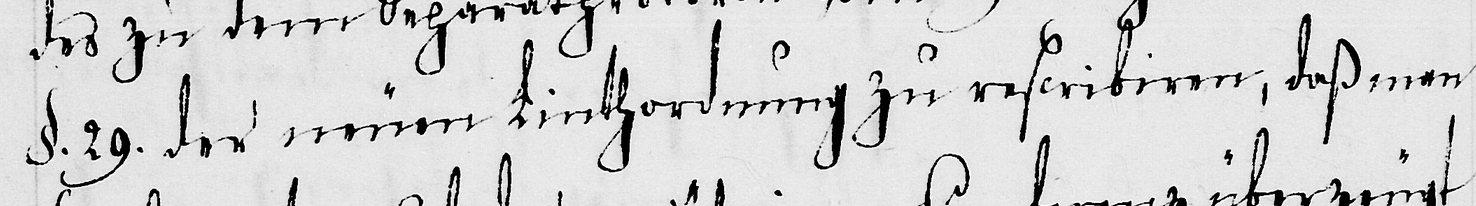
§. 29. der neuen Linthordnung zu rescribiren, daß man
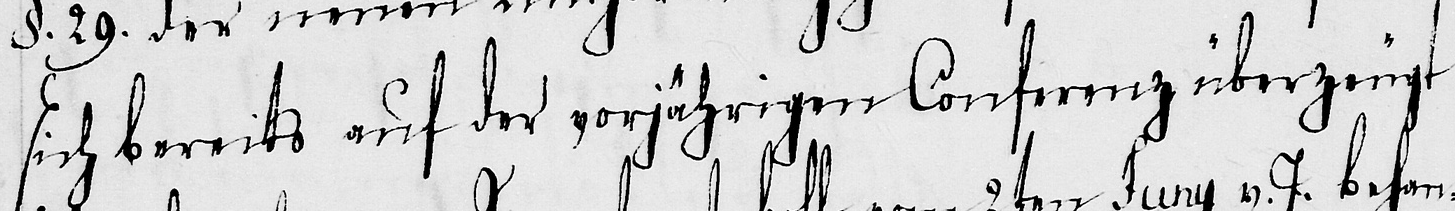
sich bereits auf der vorjährigen Conferenz überzeugt
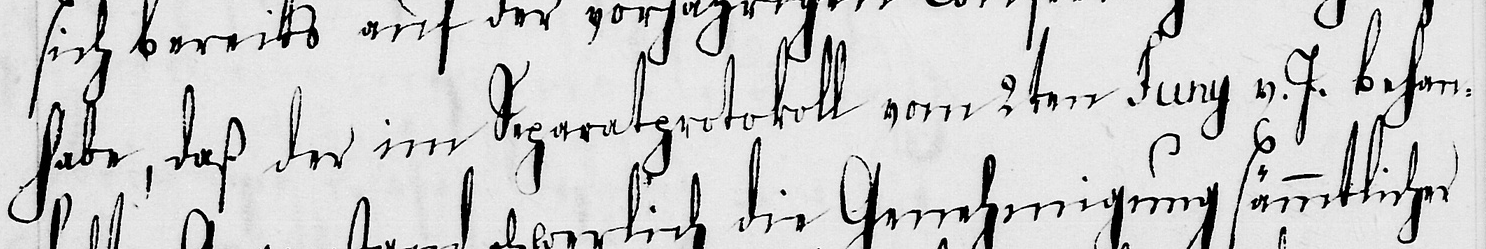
habe, daß der im Separatprotokoll vom 2ten Juny v. J. beha¬
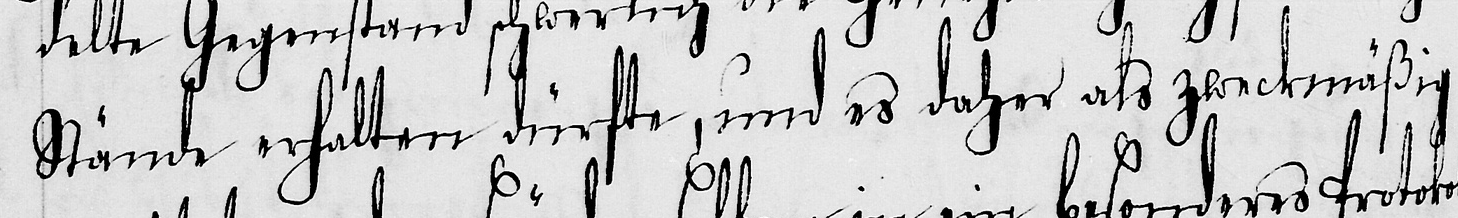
Stände erhalten dürfte, und es daher als zweckmäßig
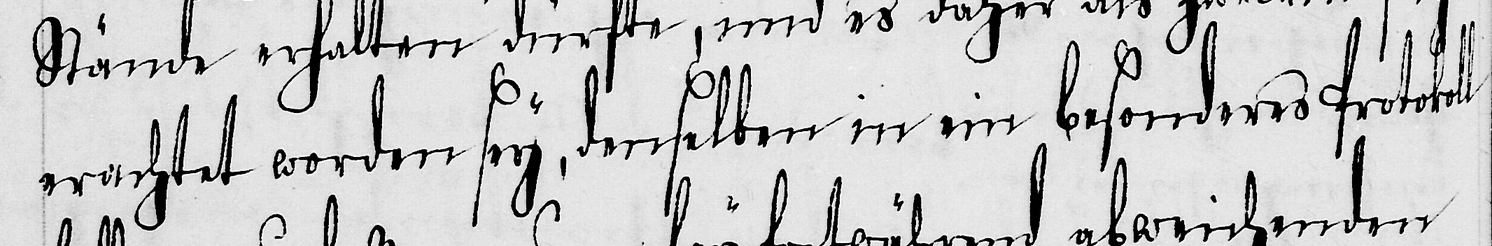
erachtet worden sey, denselben in ein besonderes Proto¬
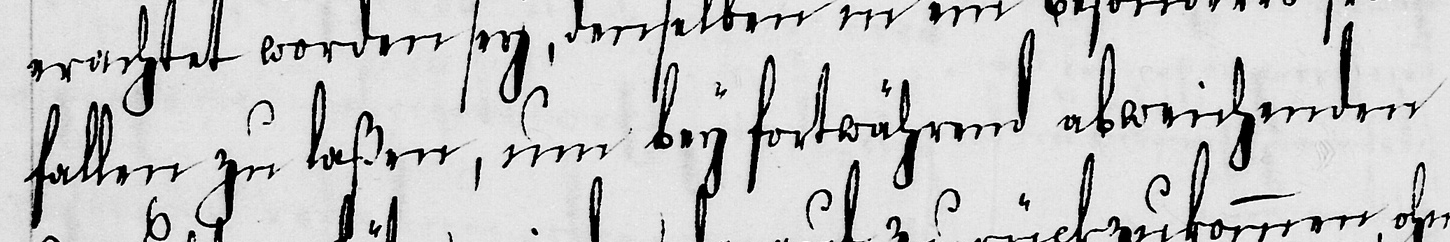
fallen zu laßen, um bey fortwährend abweichenden
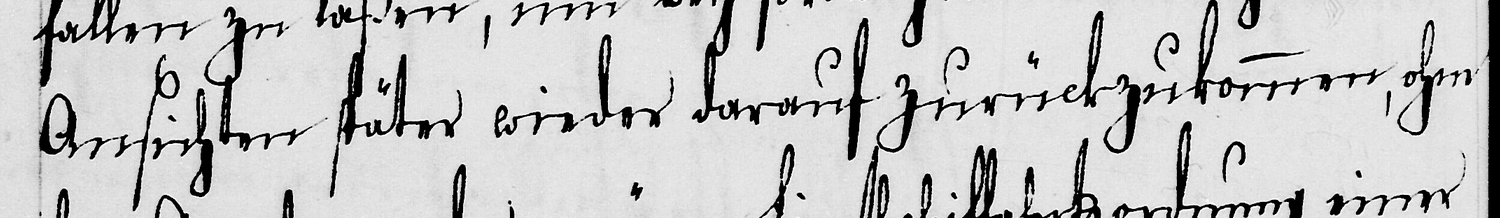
Ansichten später wieder darauf zurückzukommen, ohne
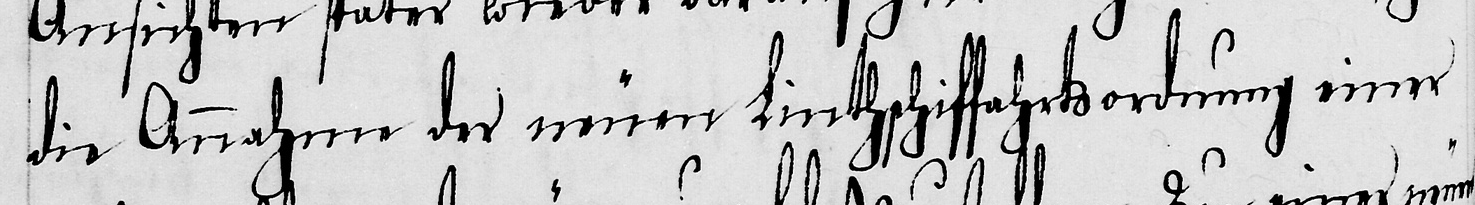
die Annahme der neuen Linthschiffahrtsordnung einer
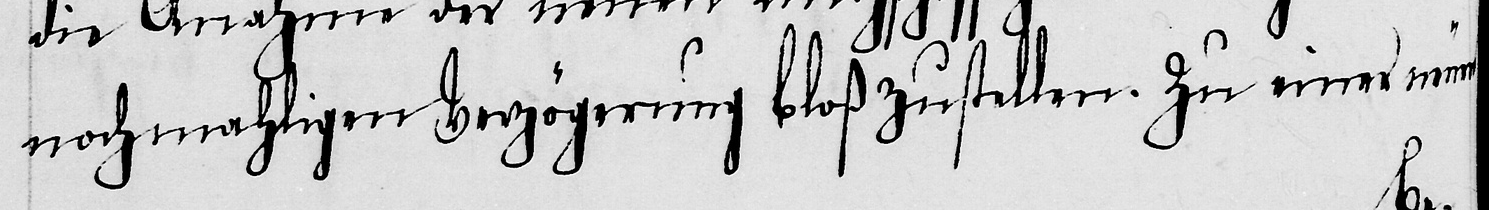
nochmahligen Verzögerung bloßzustellen. Zu einer n¬
